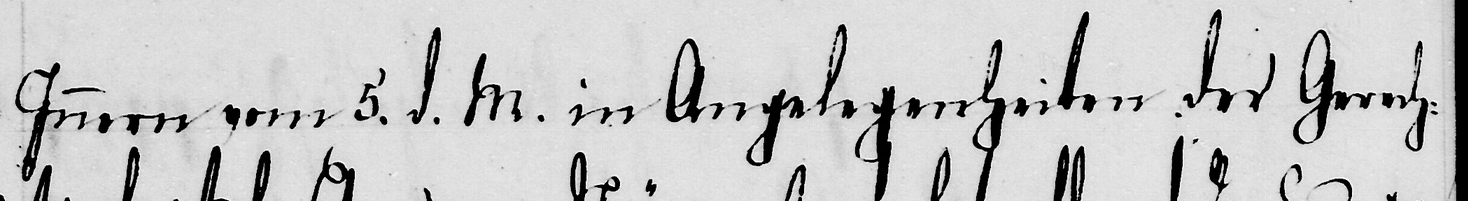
Innern vom 5. d. M. in Angelegenheiten der Gerech¬
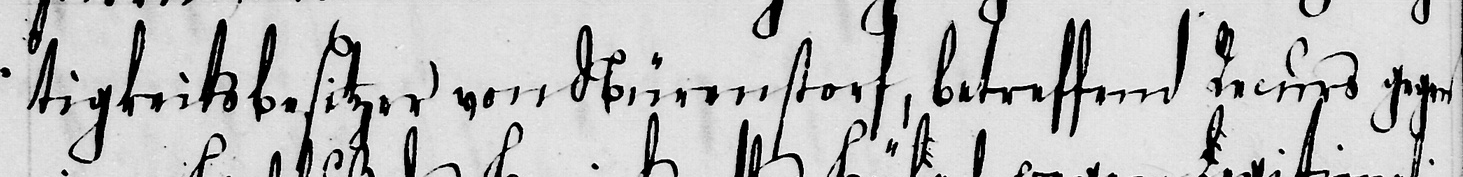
tigkeitsbesitzer von Nürenstorf, betreffend Recurs geg¬
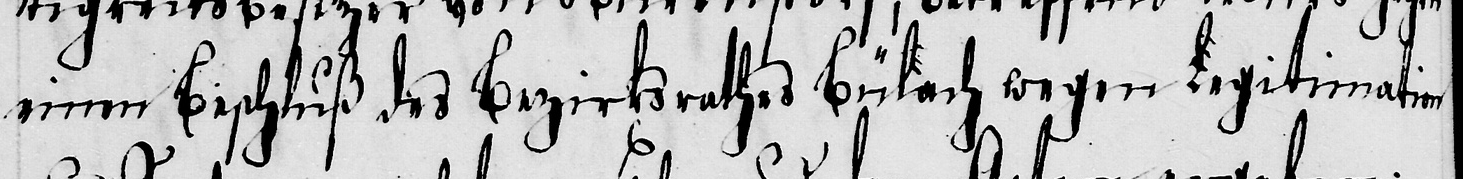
einen Beschluß des Bezirksrathes Bülach wegen Legitimation
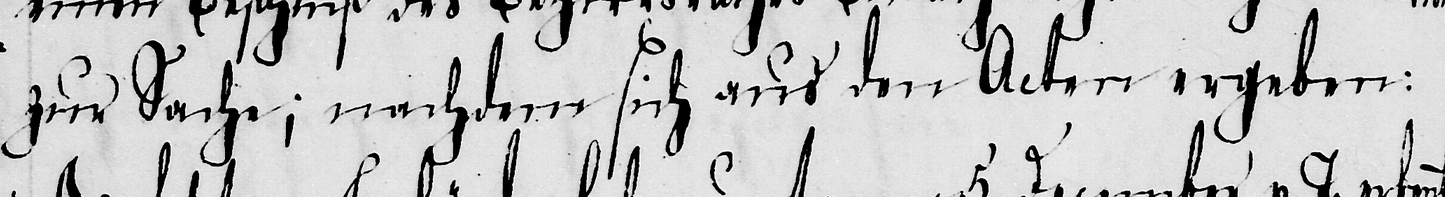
zur Sache; nachdem sich aus den Acten ergeben:
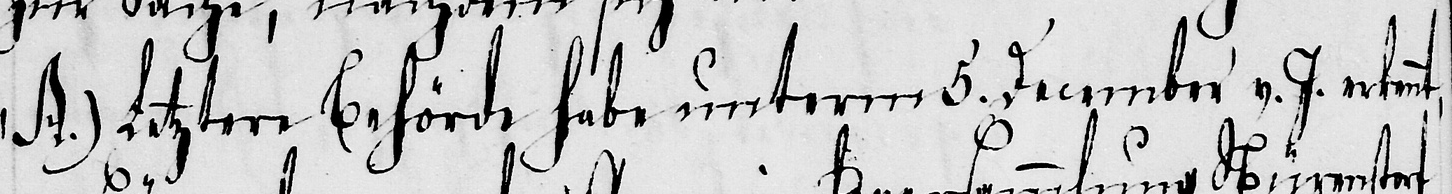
A.) Letztere Behörde habe unterm 5. December v. J. erk¬
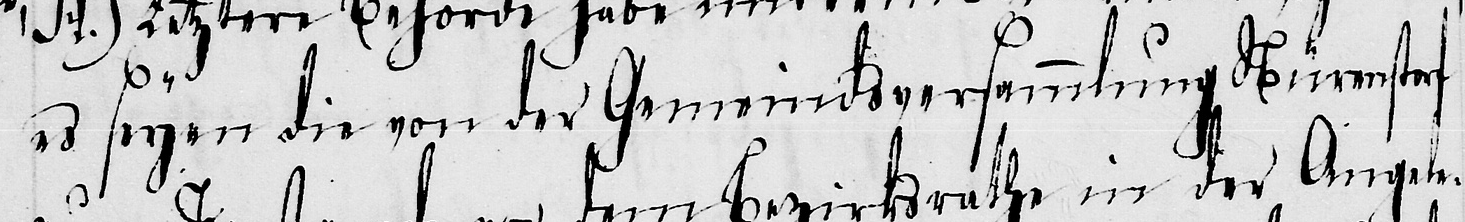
es seyen die von der Gemeindsversammlung Nürenstorf
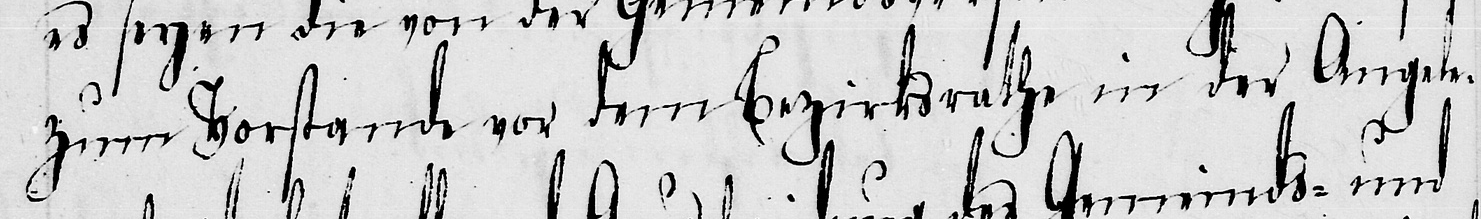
zum Vorstande vor dem Bezirksrathe in der Angel¬
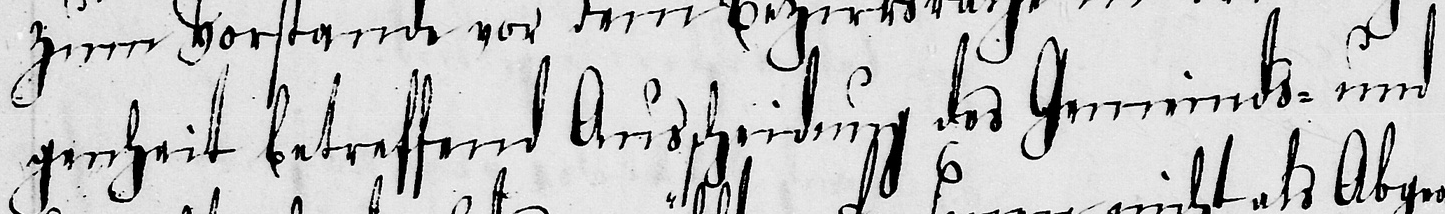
egenheit betreffend Ausscheidung des Gemeinds- und
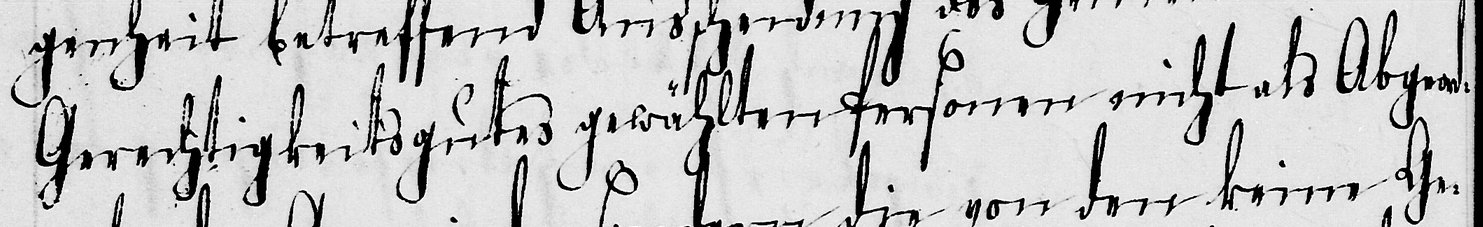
Gerechtigkeitsgutes gewählten Personen nicht als Abgeo¬
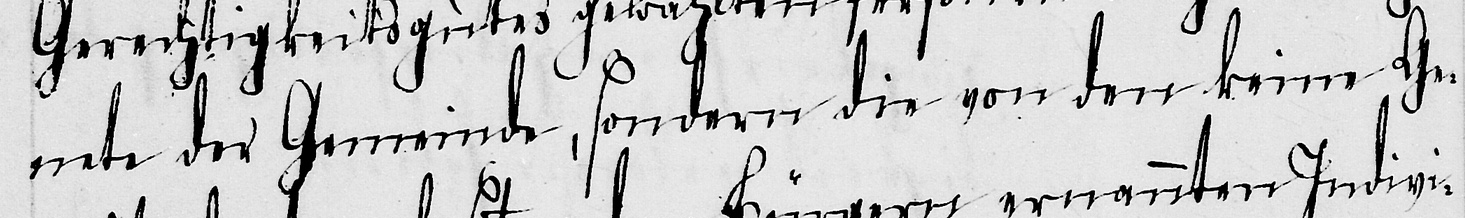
nete der Gemeinde, sondern die von den keine Ge¬
